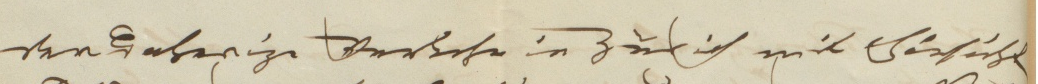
der daherige Verkehr in Zürich mit Hinsicht
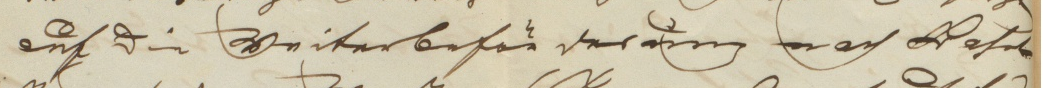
auf die Weiterbeförderung nach Basel
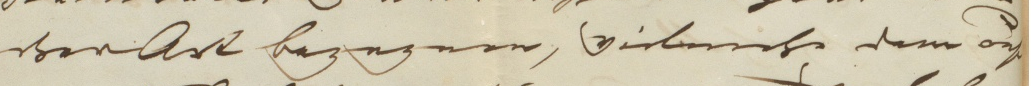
cher Art begegnen, vielmehr dem auf
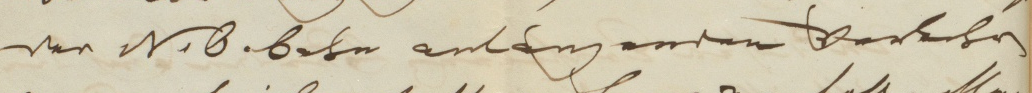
der N.O.bahn anlangenden Verkehr
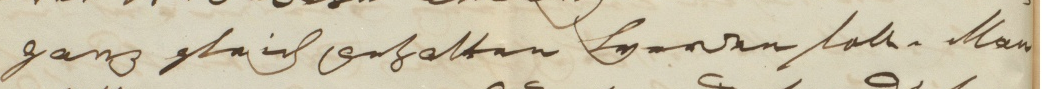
ganz gleich gehalten werden soll. Man
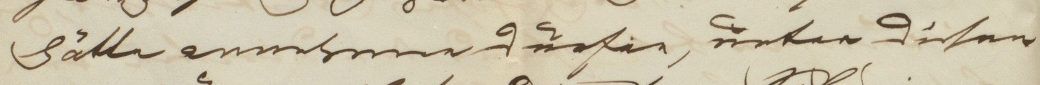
hätte annehmen dürfen, unter diesen
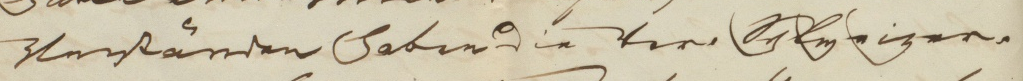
Umständen haben die Ver. Schweizer-
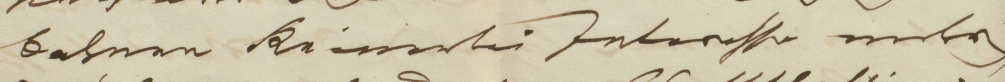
bahnen keinerlei Interesse mehr,
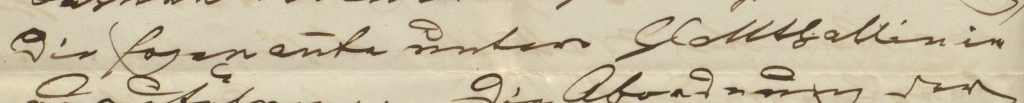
die sogenannte untere Glattthallinie
